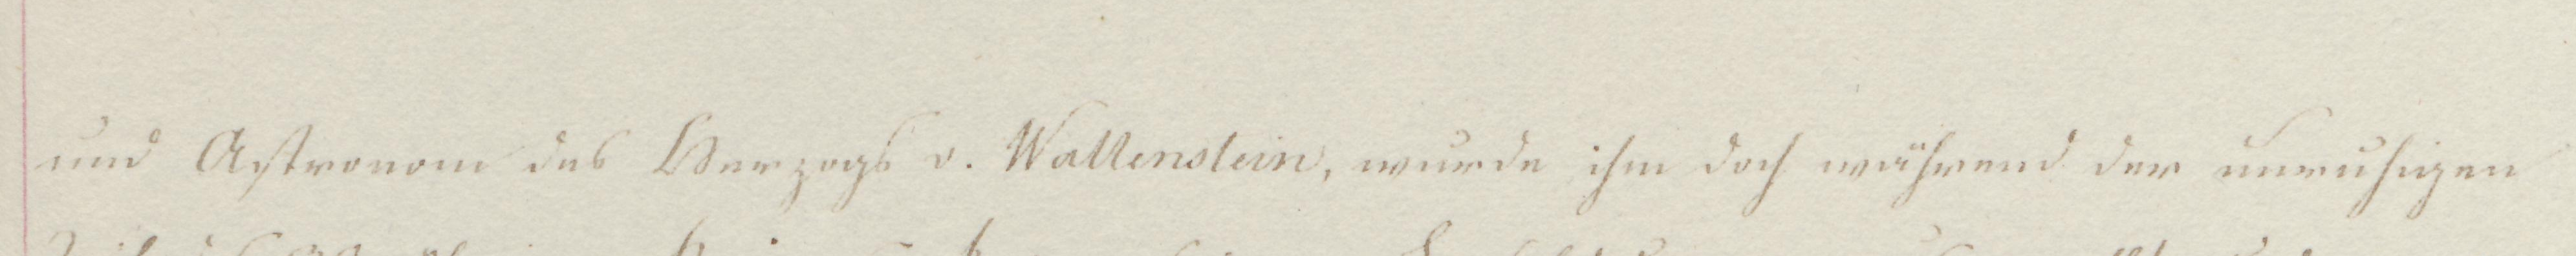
und Astronom des Herzogs v. Wallenstein, wurde ihm doch während der unruhigen
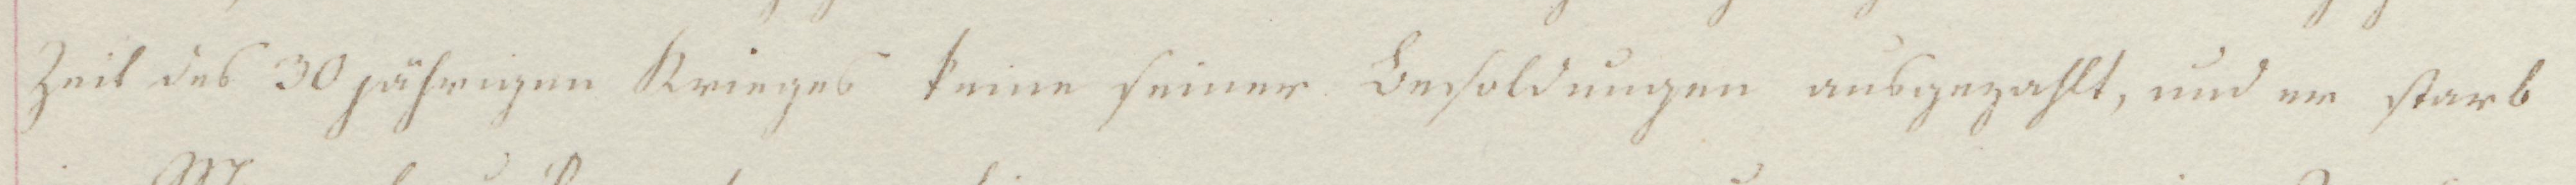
Zeit des 30jährigen Krieges keine seiner Besoldungen ausgezahlt, und er starb
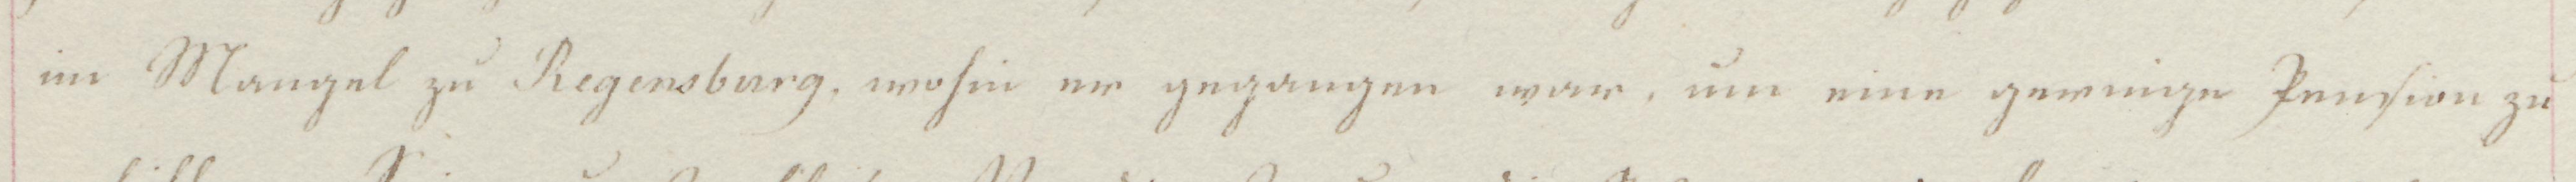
im Mangel zu Regensburg, wohin er gegangen war, um eine geringe Pension zu
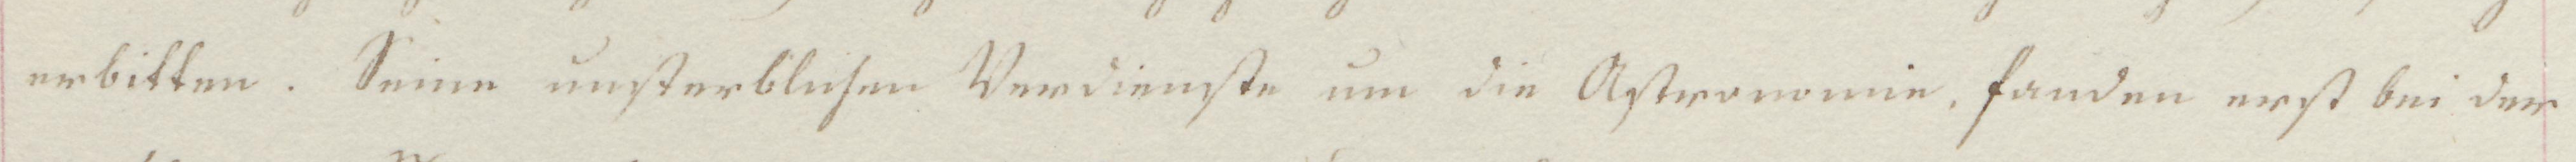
erbitten. Seine unsterblichen Verdienste um die Astronomie, fanden erst bei der
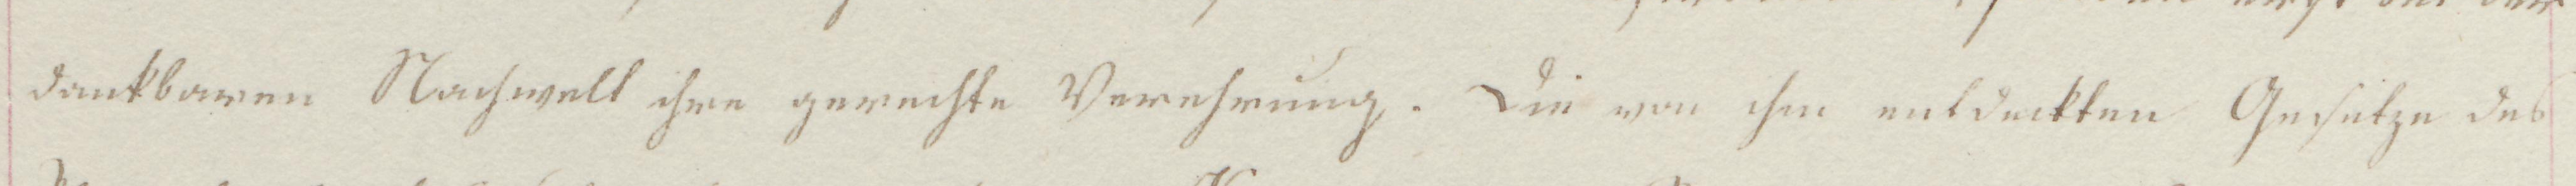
dankbaren Nachwelt ihre gerechte Verehrung. Die von ihm entdeckten Gesetze des
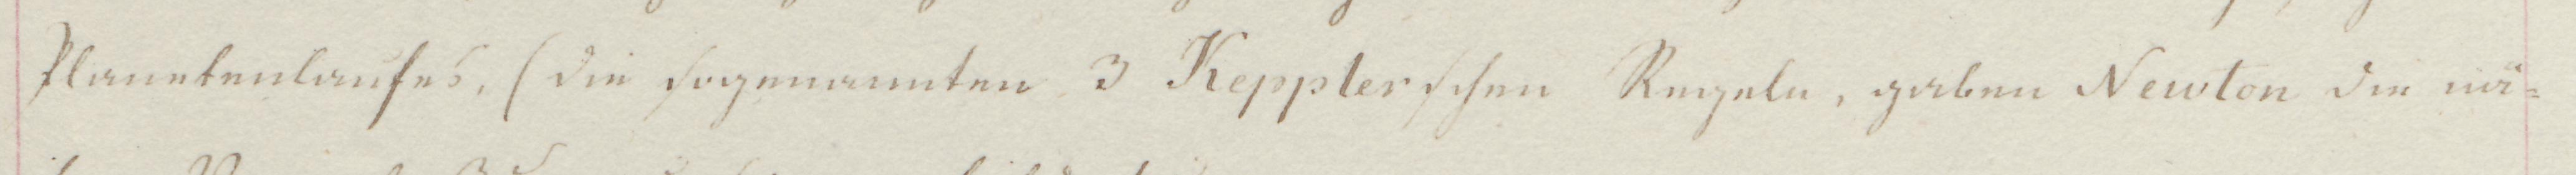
Planetenlaufes, (die sogenannten 3 Kepplerschen Regeln gaben Newton die nä-
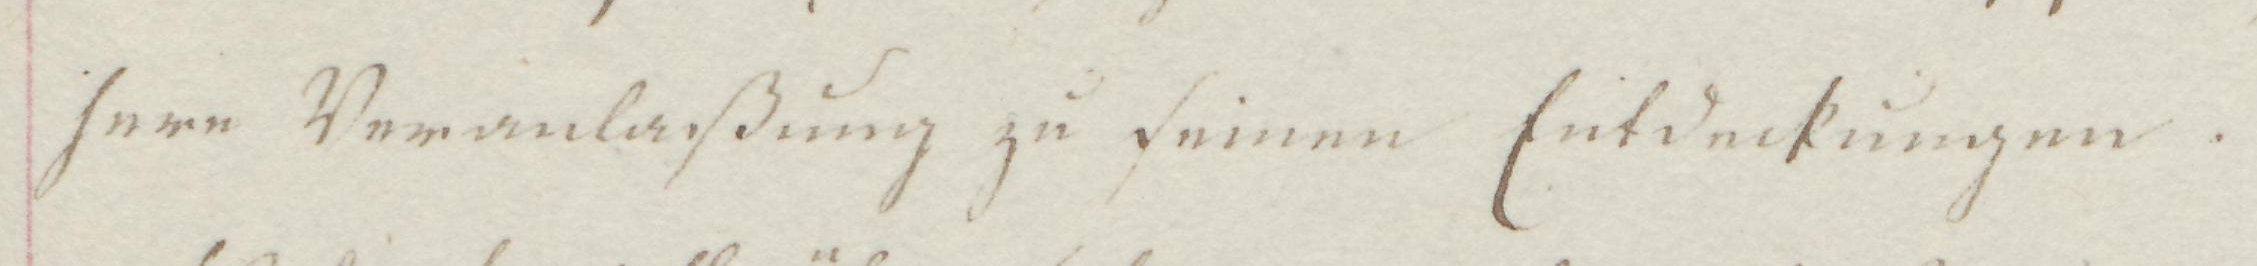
here Veranlaßung zu seinen Entdeckungen.
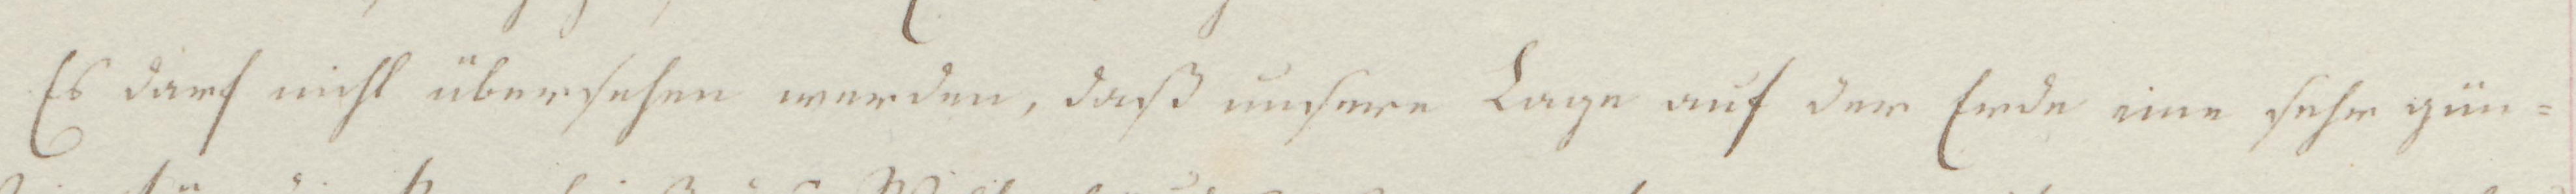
Es darf nicht übersehen werden, daß unsere Lage auf der Erde eine sehr gün-
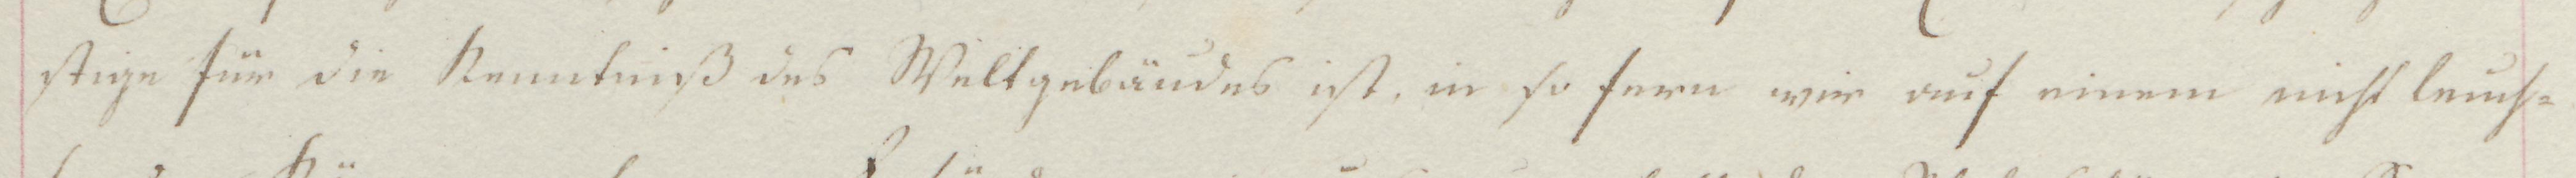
stige für die Kenntniß des Weltgebäudes ist, in so fern wir auf einem nicht leuch-
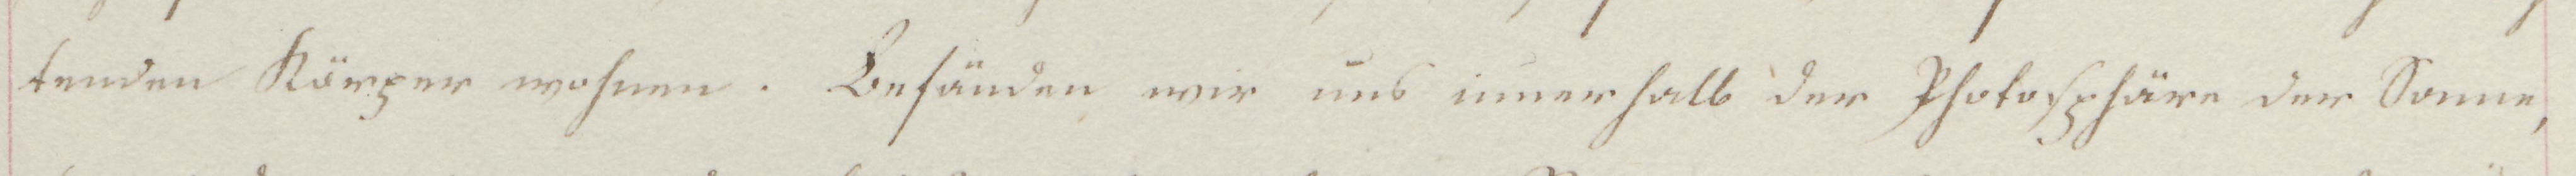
tenden Körper wohnen. Befänden wir uns innerhalb der Photosphäre der Sonne,
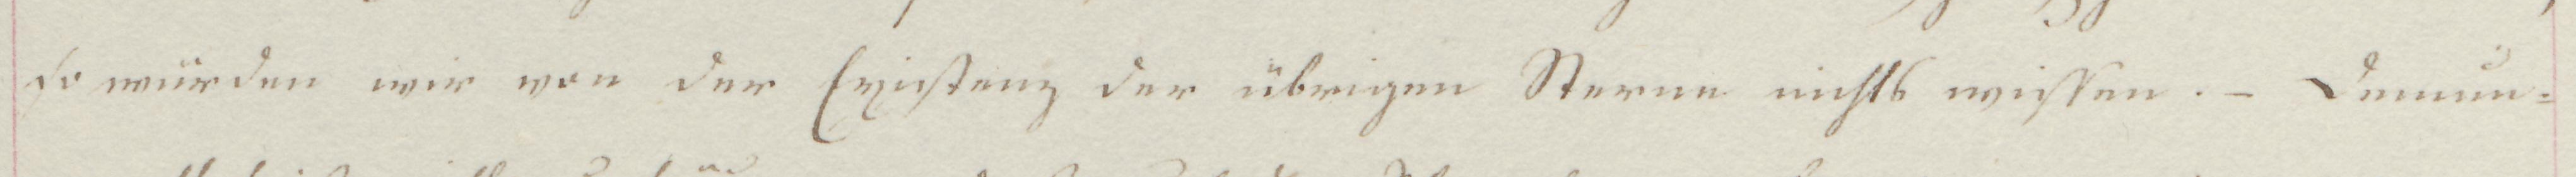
so würden wir von der Existenz der übrigen Sterne nichts wissen. – Demun-
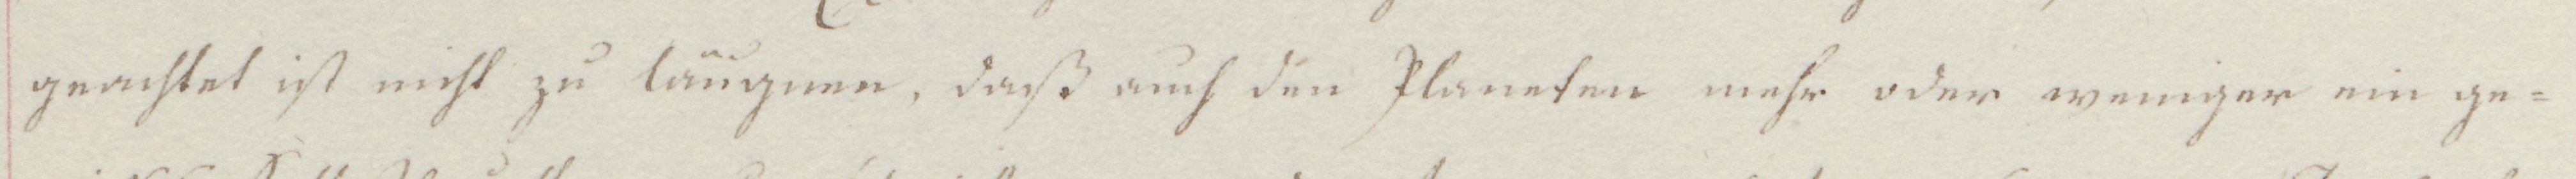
geachtet ist nicht zu läugnen, daß auch den Planeten mehr oder weniger ein ge-
